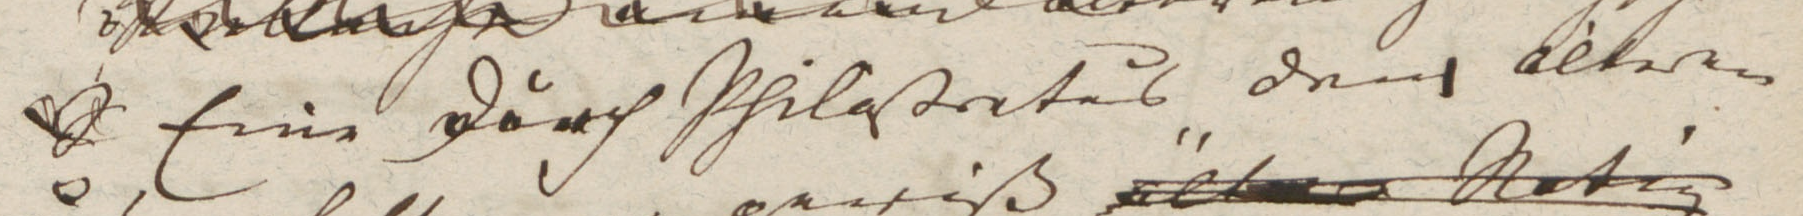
S Eine vondurch Philostratus demn älteren
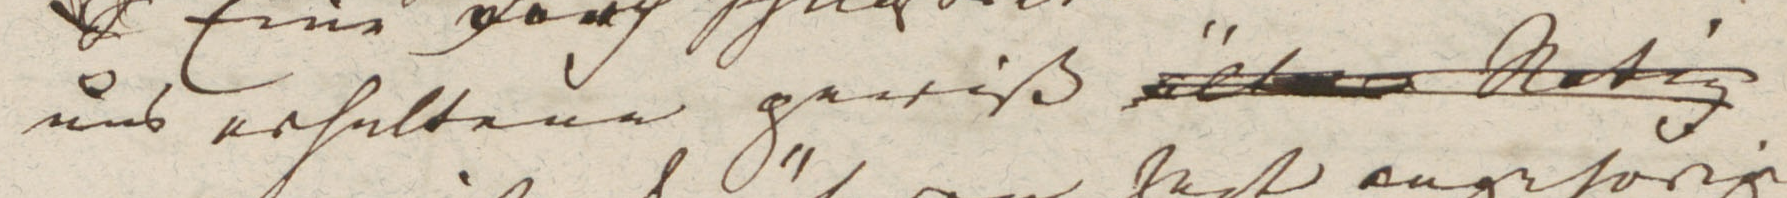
uns erhaltene gewiss ältere Notiz
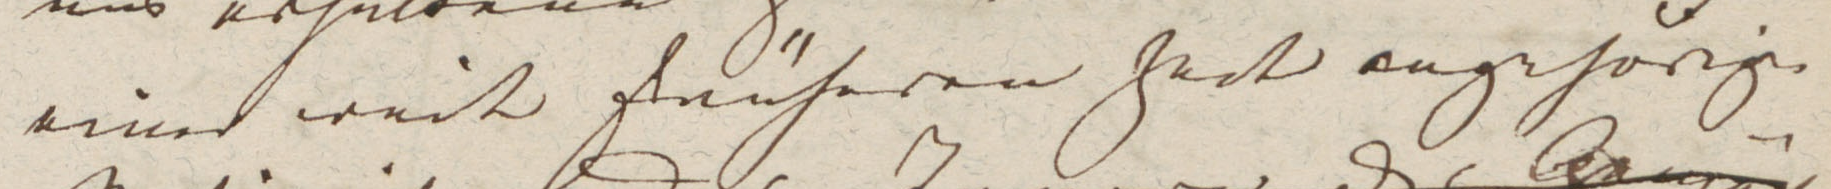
einer weit früheren Zeit angehörige
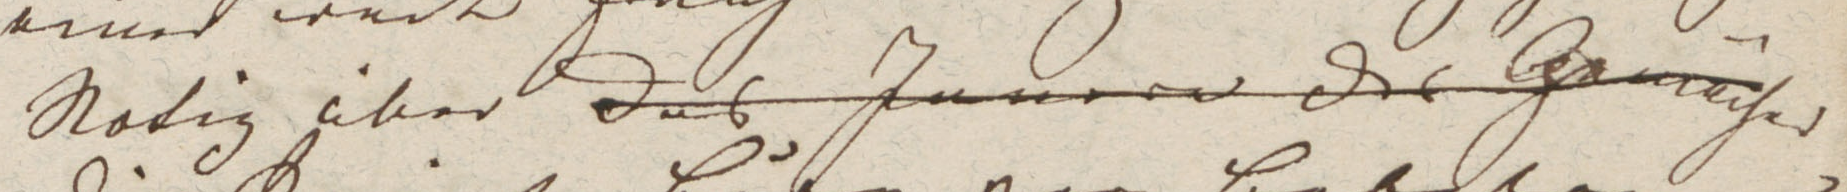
Notiz über das Innere der Gemächer
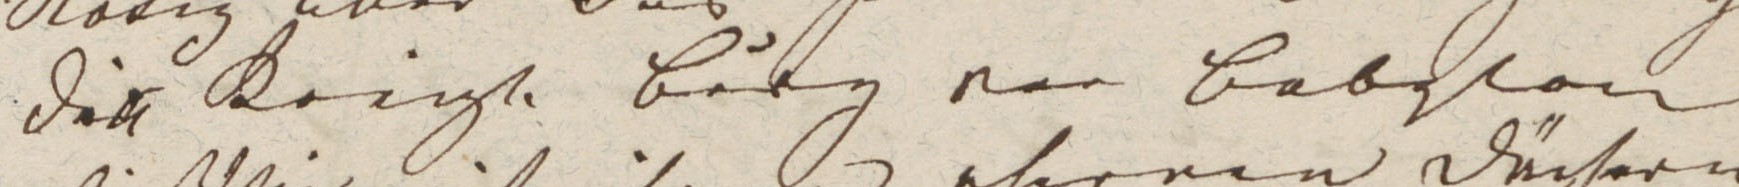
desie Konigl. Burg von Babylon
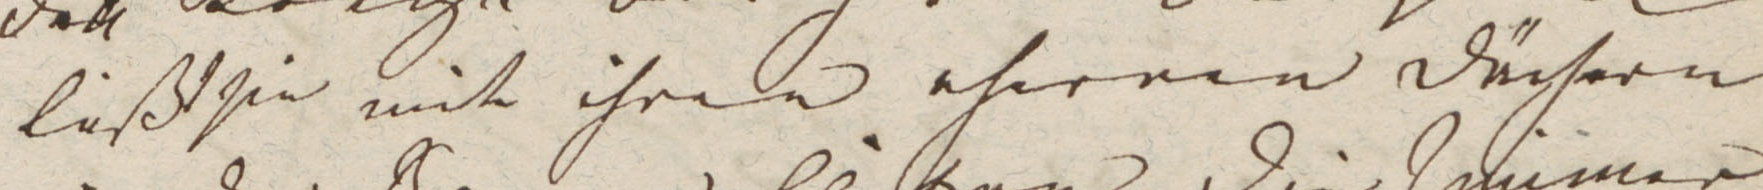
lässt sie mit ihren ehernen Dächern
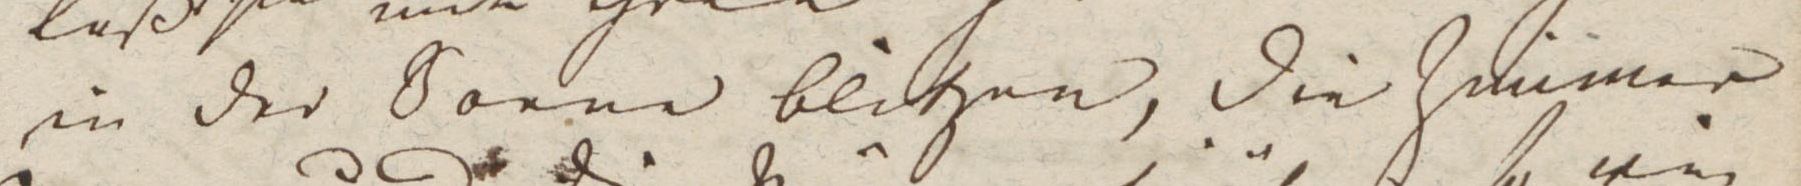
in der Sonne blitzen, die Zimmer
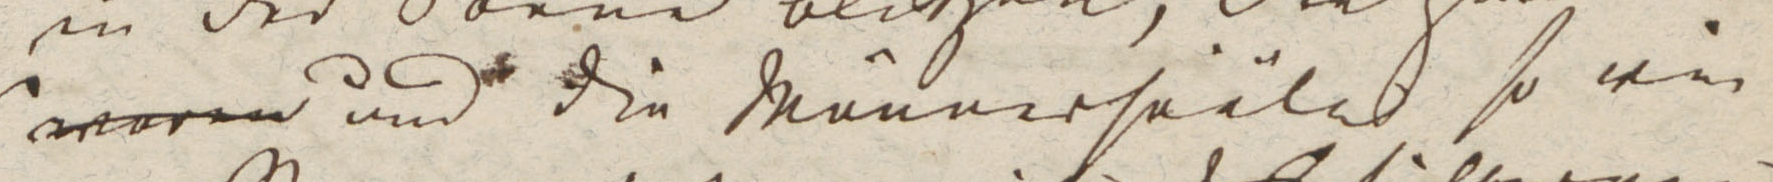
waren und die Männersääle so wie
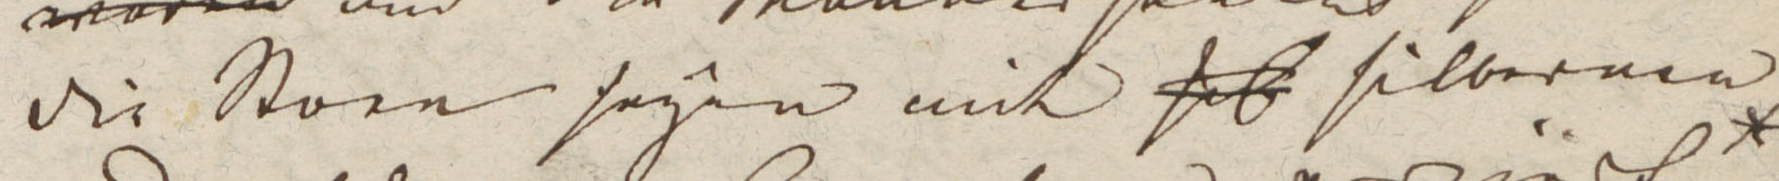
die Stoen seyen mit sil silbernen
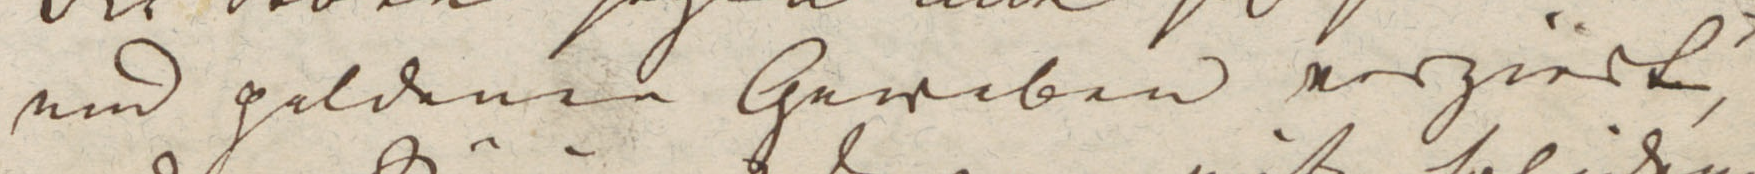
und goldenen Geweben verziert, %
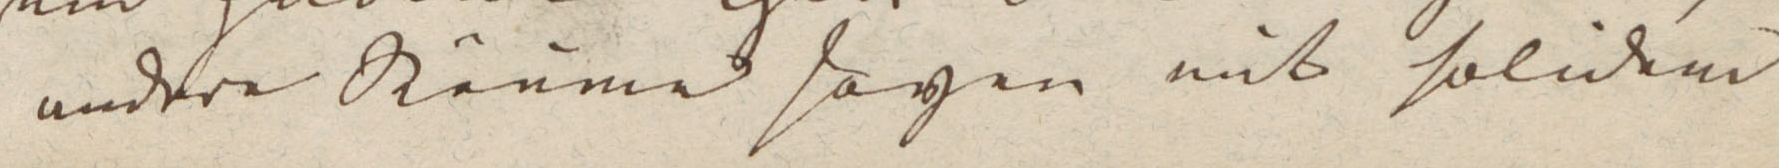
andere Räume seyen mit solidem
